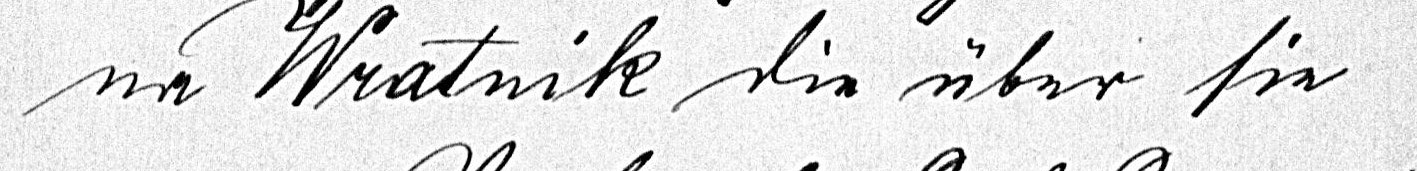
na Wratnik die über sie
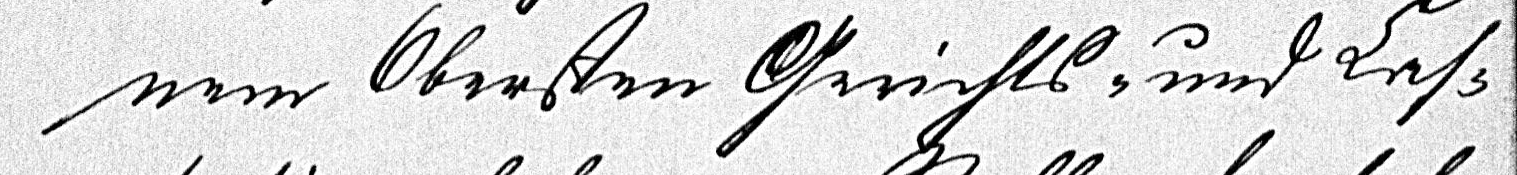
nem Obersten Gerichts- und Cas¬
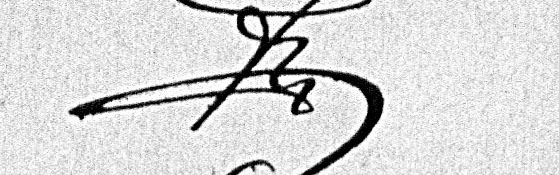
xx
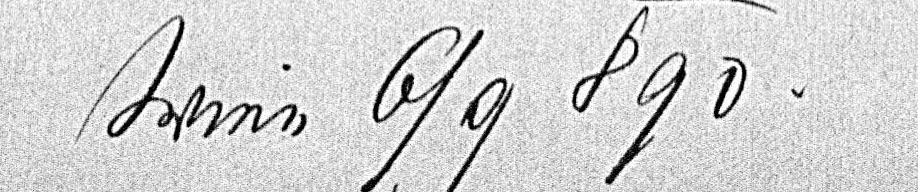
Wien 6/9 890.
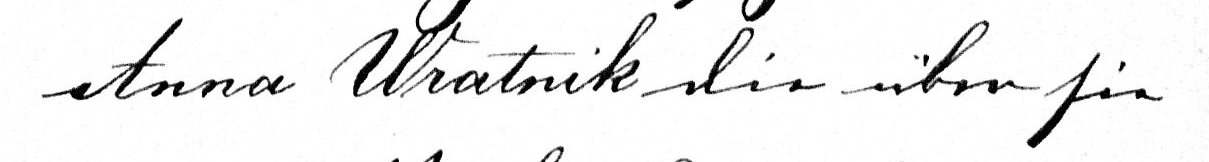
Anna Wratnik die über sie
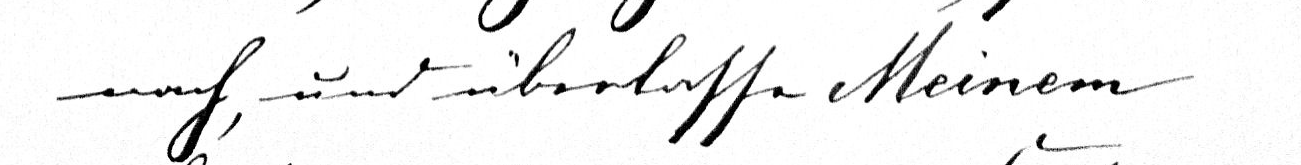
nach, und überlasse Meinem
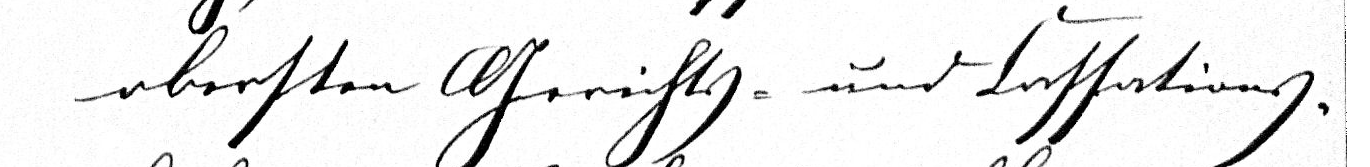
obersten Gerichts- und Cassation¬
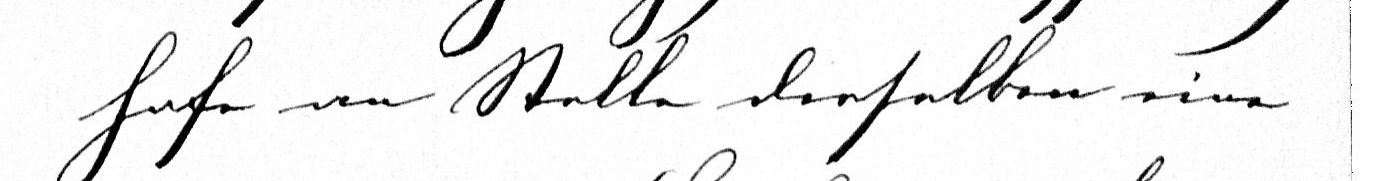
hofe an Stelle derselben eine
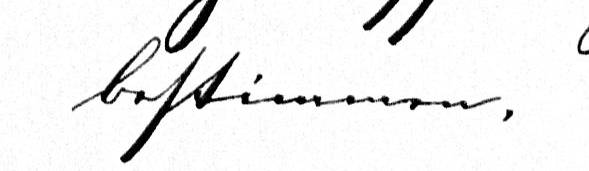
bestimmen.
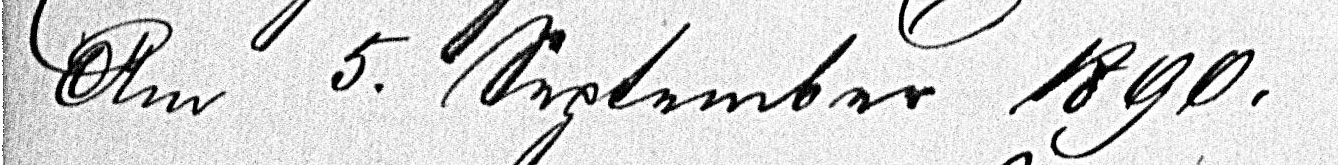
Am 5. September 1890.
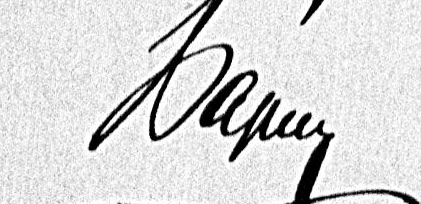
xx
